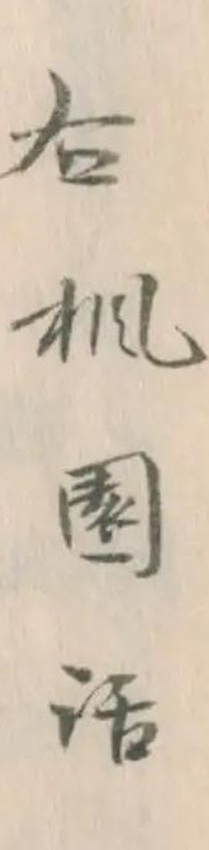右楓園話
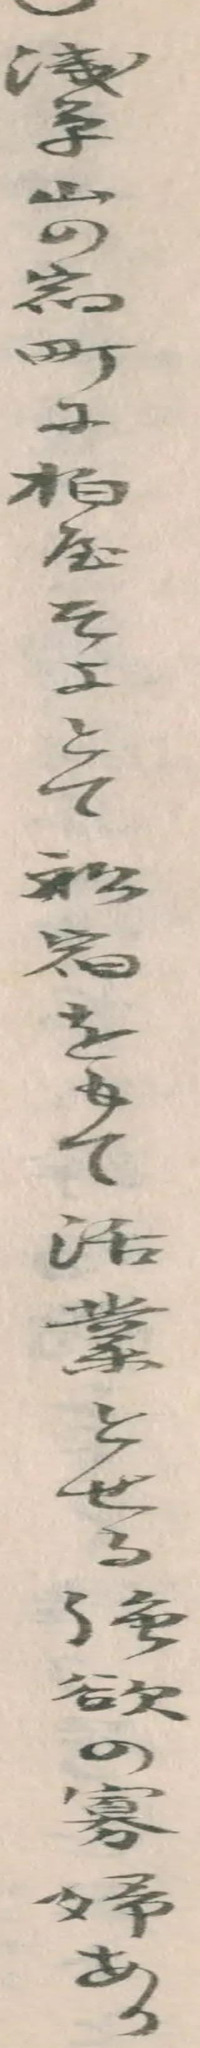〇浅草山の宿町に柏屋そよとて船宿をもて活業とせる強欲の寡婦あり
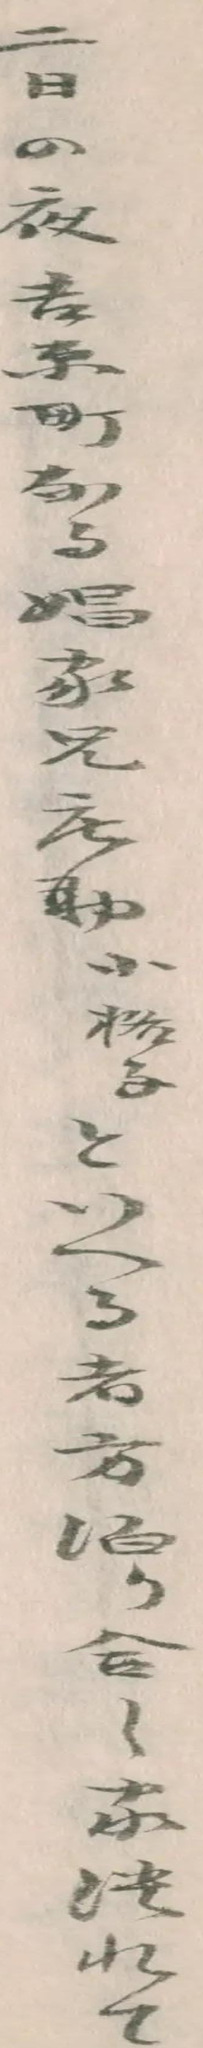二日の夜吉原町なる娼家兄庄助小格子といへる者方泊り合し家潰れて
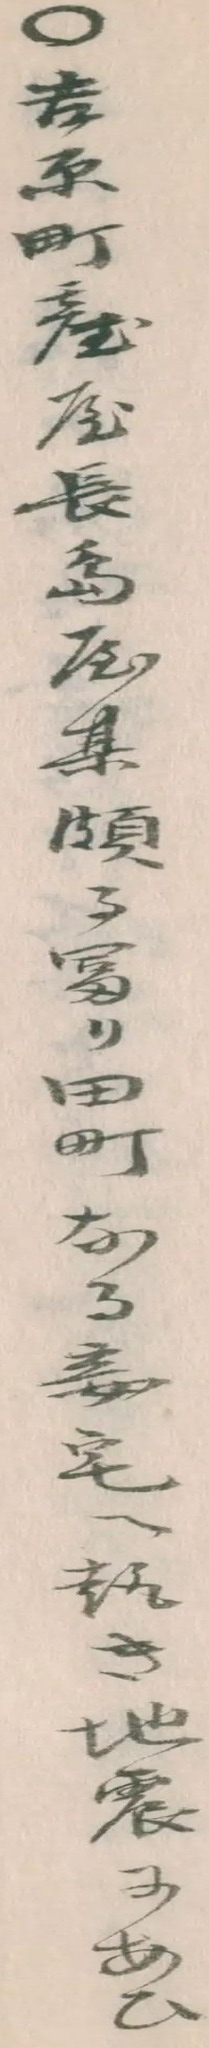〇吉原町産屋長島屋某頗る冨り田町なる妾宅へ趣き地震にあひ
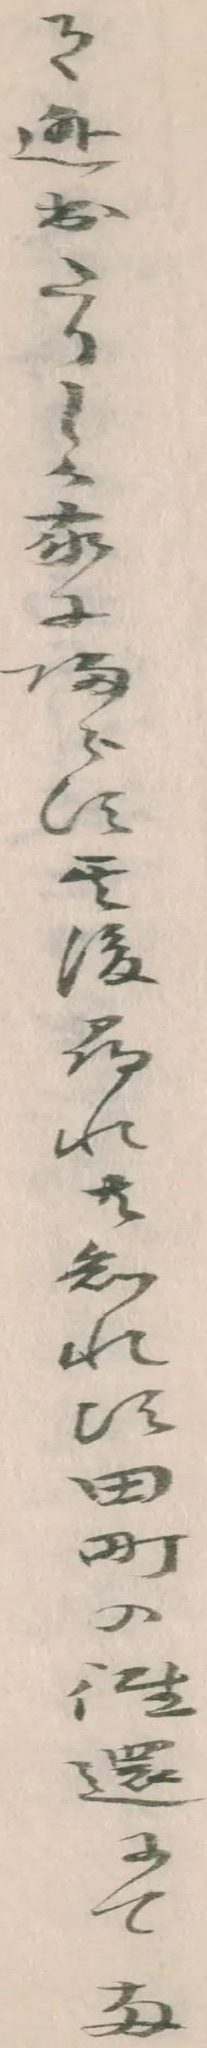て逃出たりしか家に帰らす其後尋れ共知れす田町の往還にて両
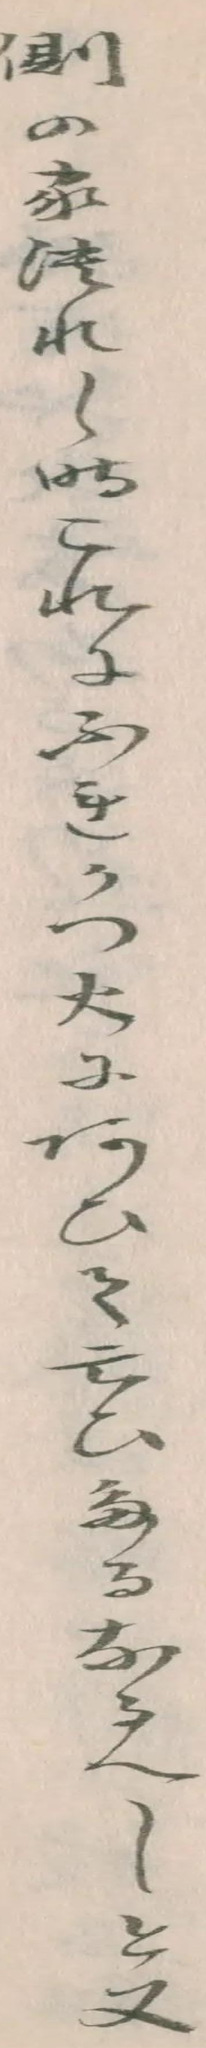側の家潰れし時これにふれかつ大にあひて亡ひたるなるへしと又
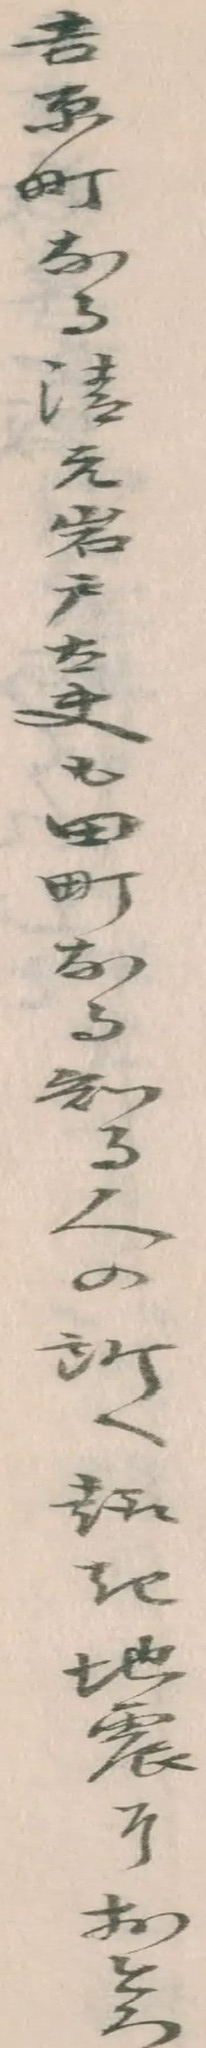吉原町なる清元岩戸太夫も田町なる知る人の所へ趣き地震におとろ
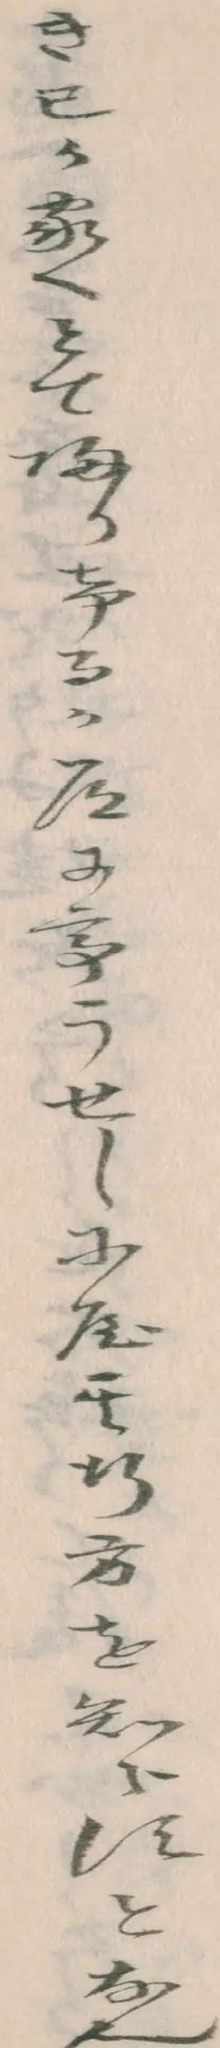き己か家へとて帰りけるか道にてうせしにや其行方を知らすとなん
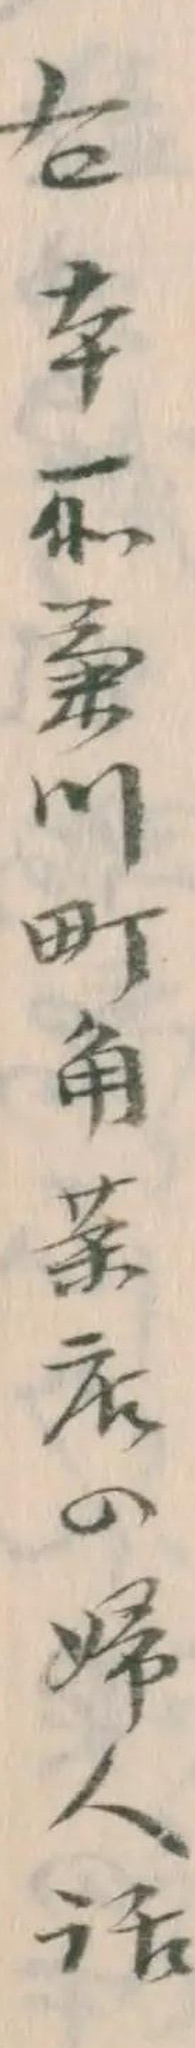右本所菊川町角茶店の婦人話
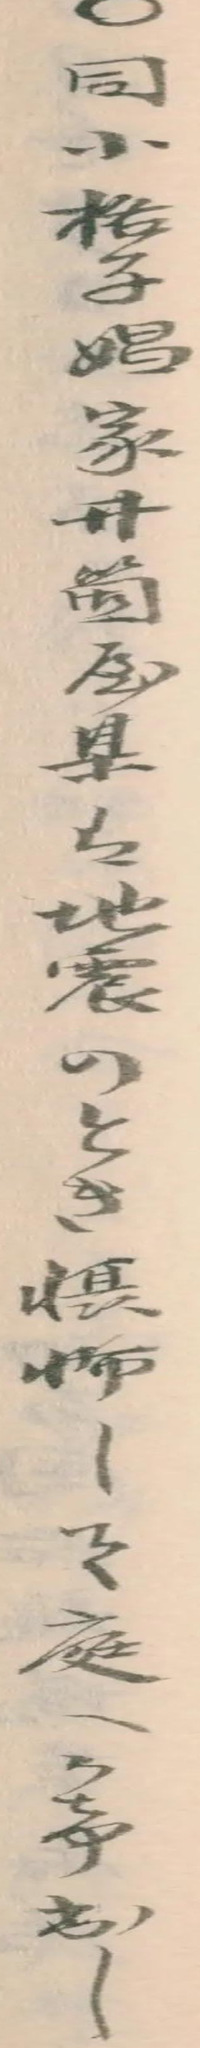〇同小格子娼家井箇屋某は地震のとき懾怖して庭へかけ出し
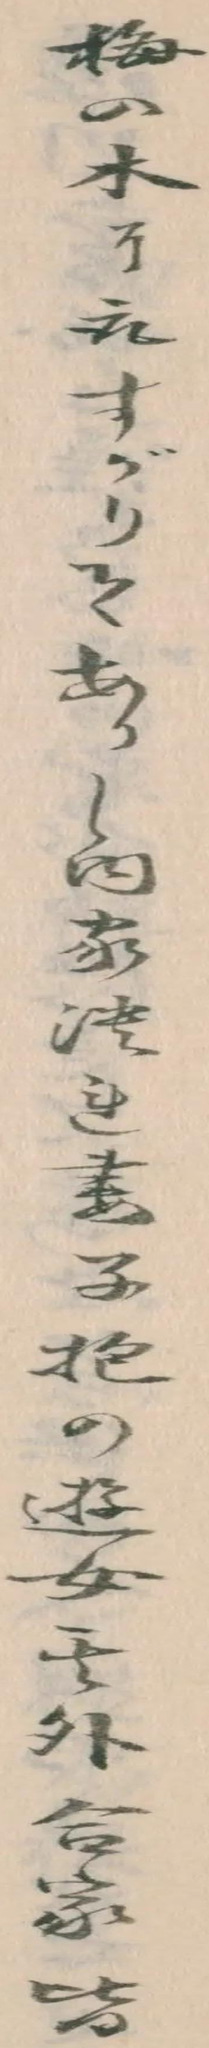梅の木に取すがりてありし内家潰れ妻子抱の遊女其外合家皆
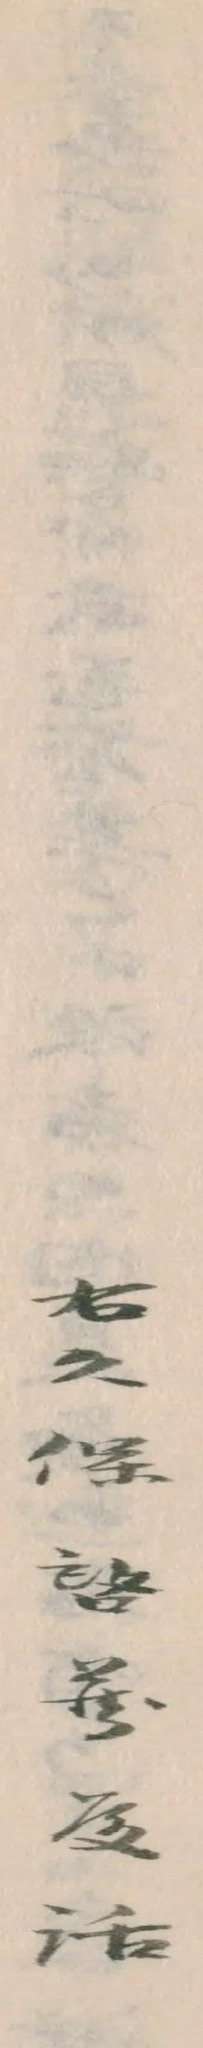右久保啓蔵殿話
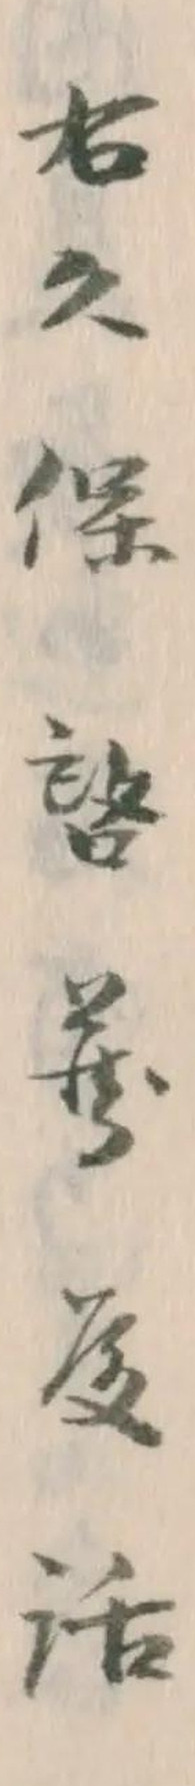右久保啓蔵殿話
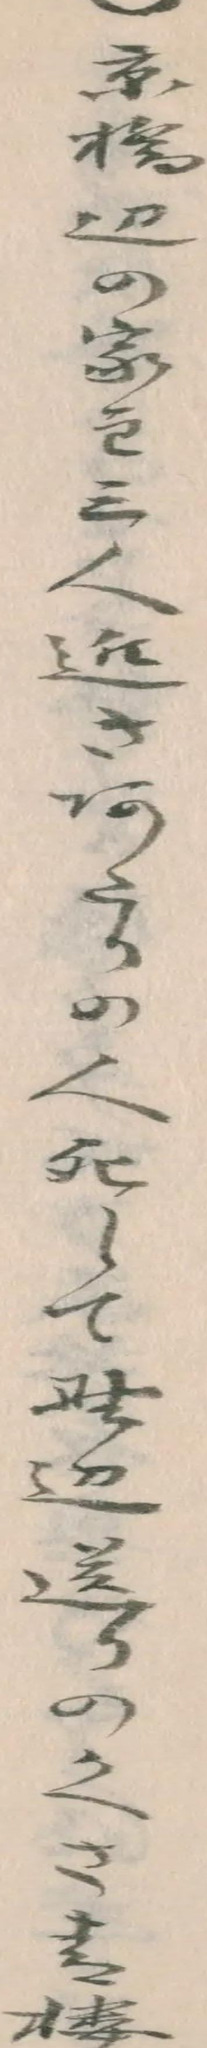〇京橋辺の家主三人近きあたりの人死して野辺送りのかへさ青楼
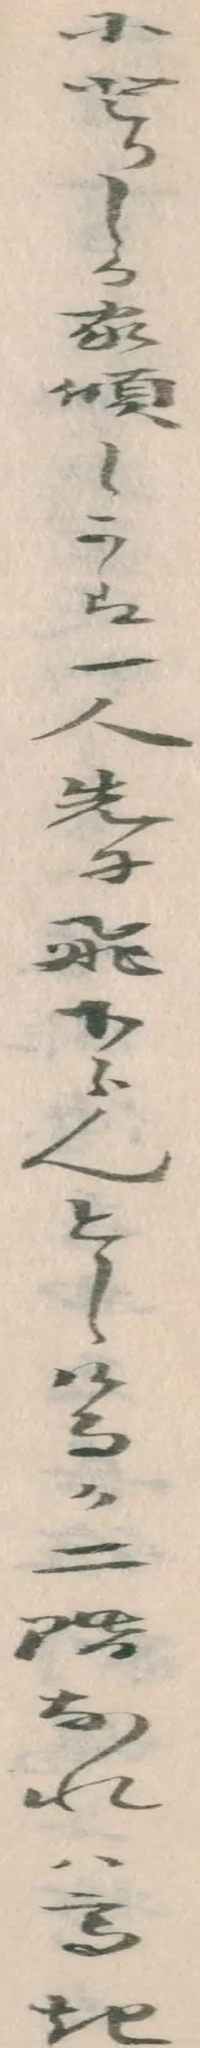に登りしか家傾しかは一人先に飛下らんとしけるか二階なれは高き
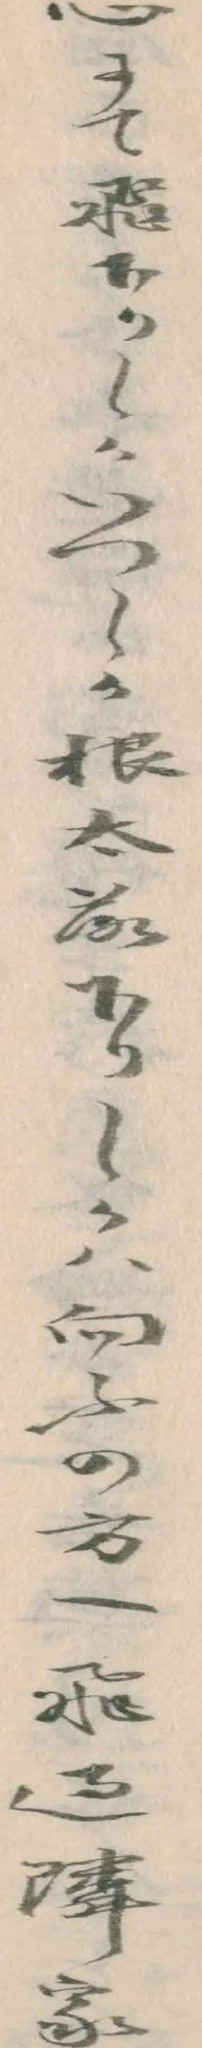心にて飛下りしかいつしか根太落下りしかは向ふの方へ飛過隣家
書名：地災撮要. 巻10(地震之部) 上,下
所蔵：国立国会図書館 National Diet Library, JAPAN
